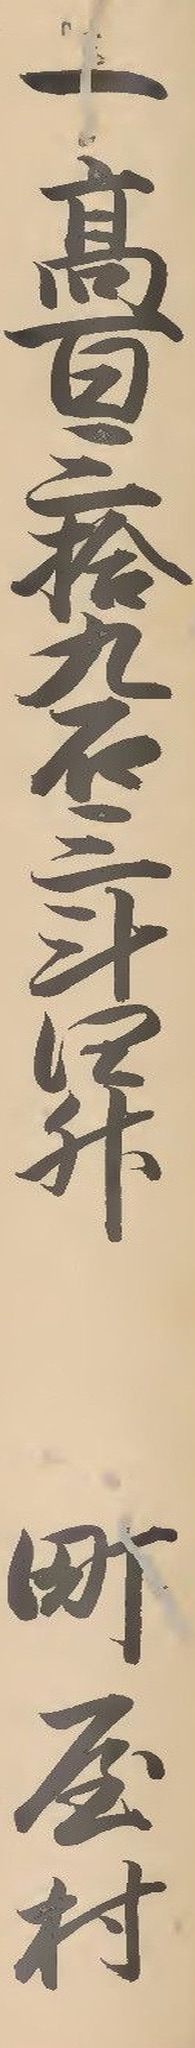一髙百三拾九石三斗四升町屋村
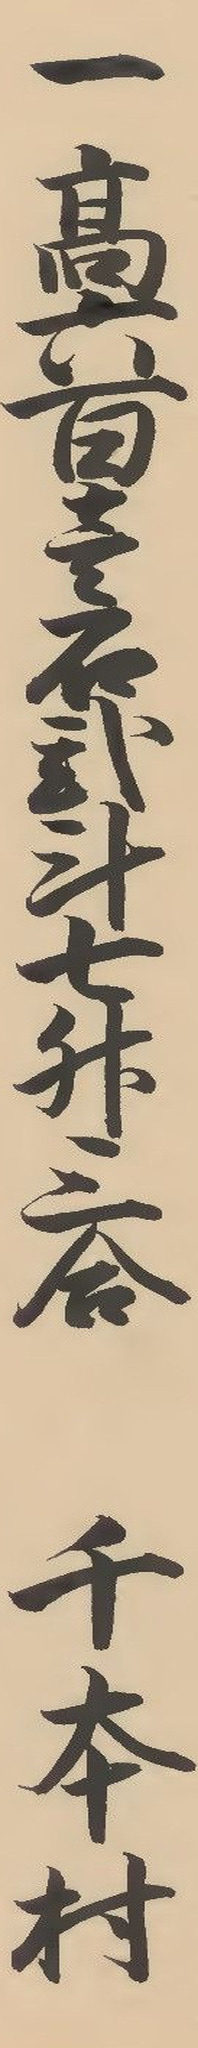一髙六百壱石弐斗七升三合千本村
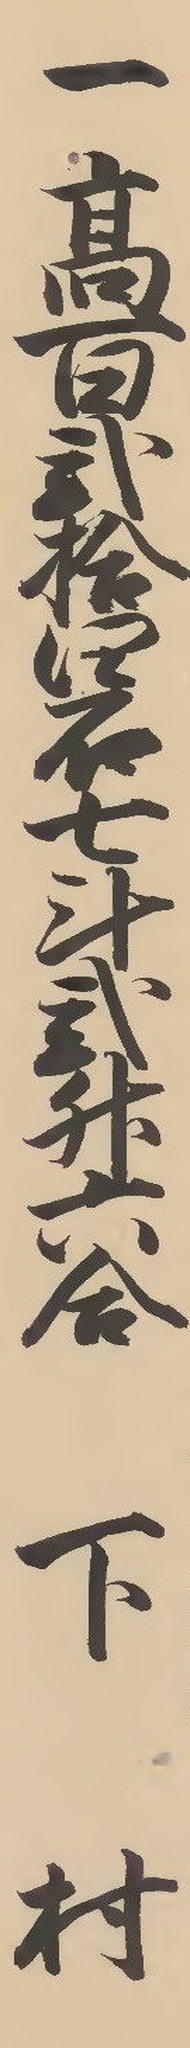一髙百弐拾四石七斗弐升六合下村
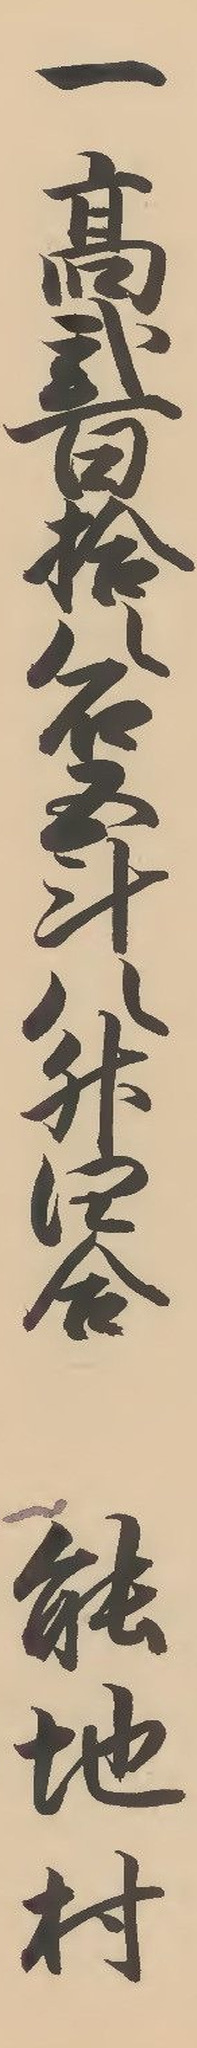一髙弐百拾八石五斗八升四合能地村

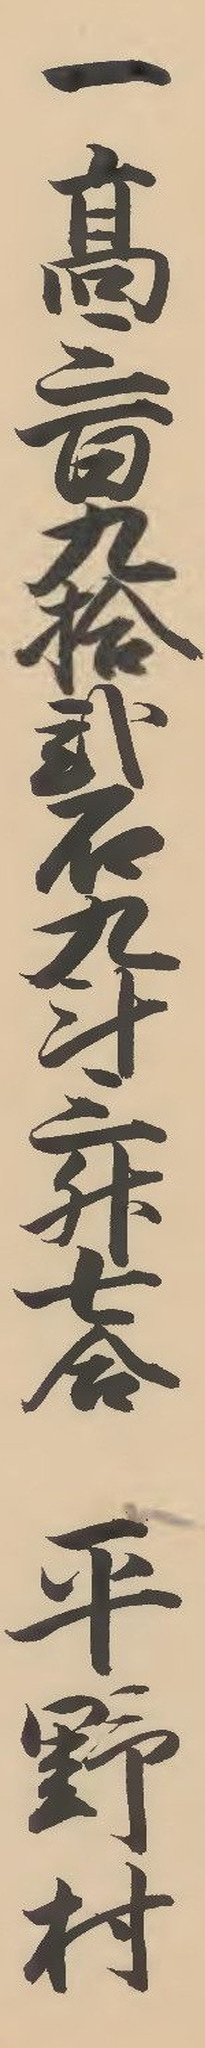一髙三百九拾弐石九斗三升七合平野村
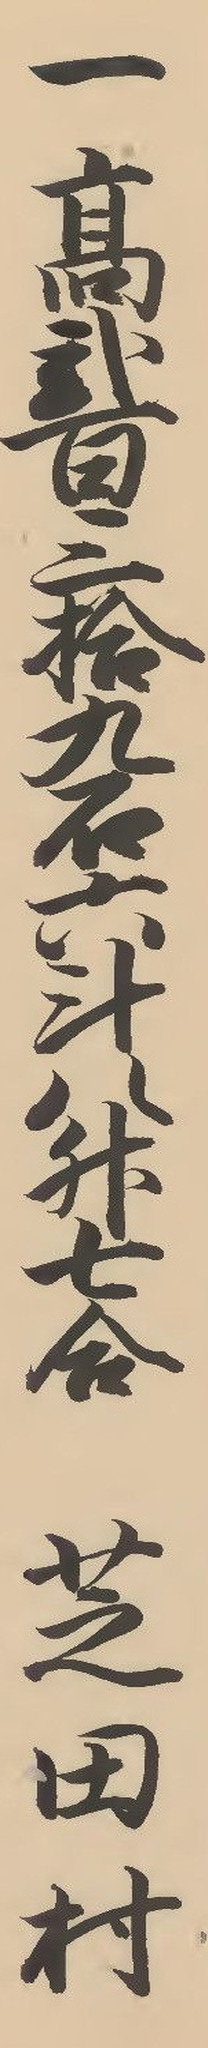一髙弐百三拾九石六斗八升七合芝田村
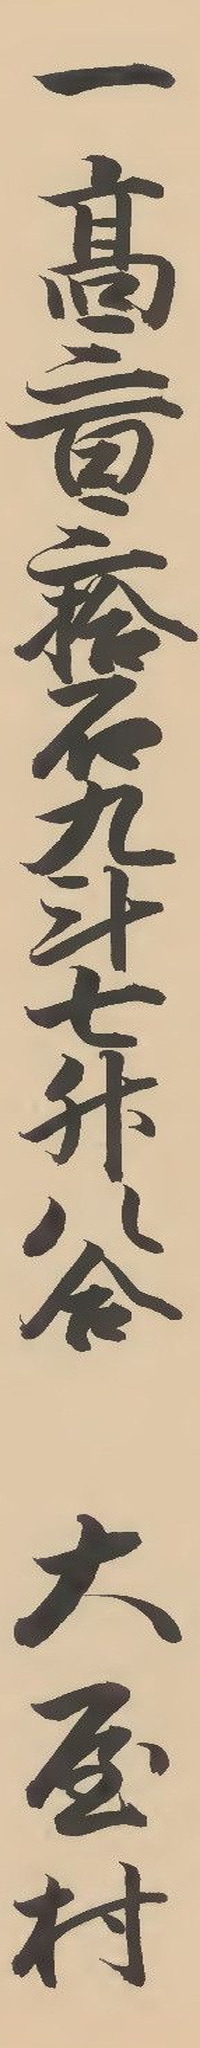一髙三百三拾石九斗七升八合大屋村
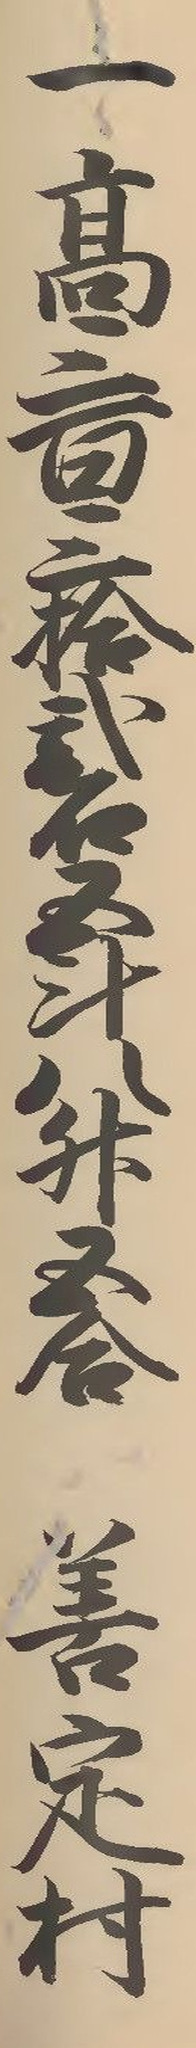一髙三百三拾弐石五斗八升五合善定村
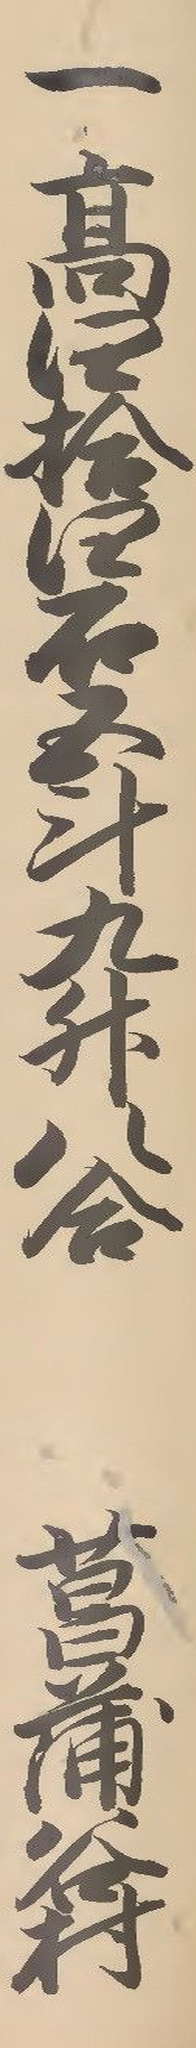一髙四拾四石五斗九升八合菖蒲谷村
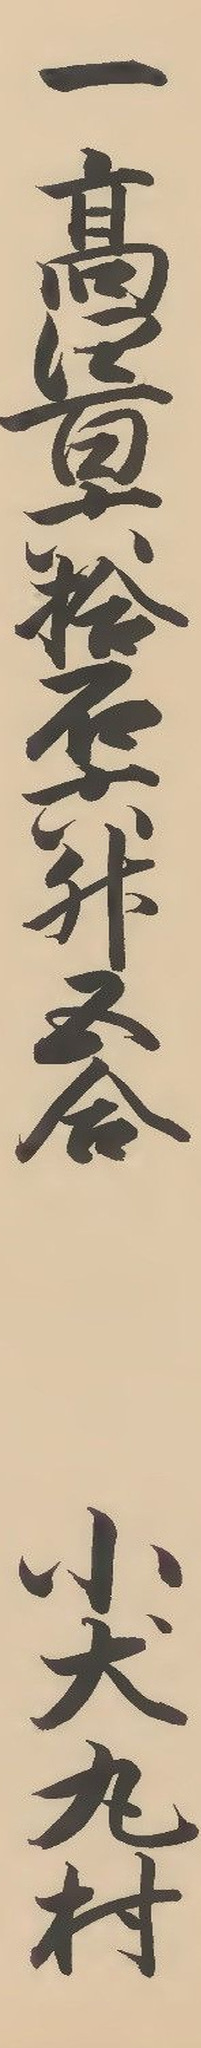一髙四百六拾石六升五合小犬丸村
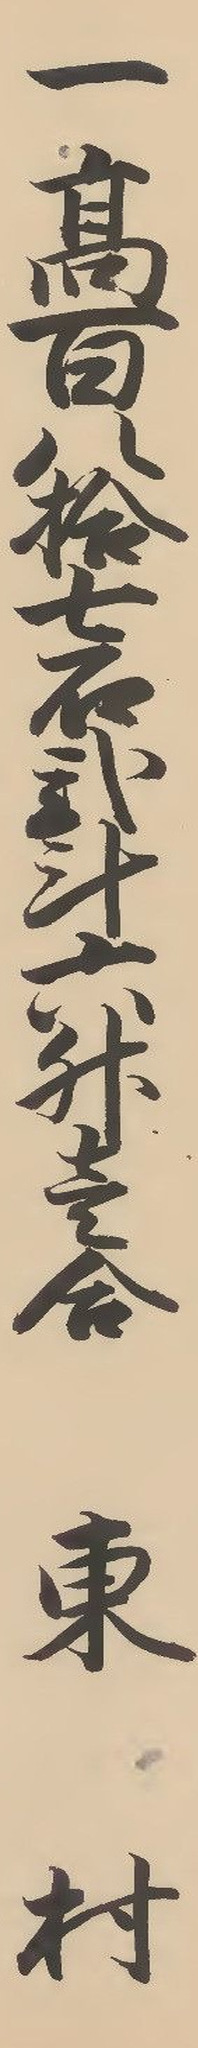一髙百八拾七石弐斗六升壱合東村
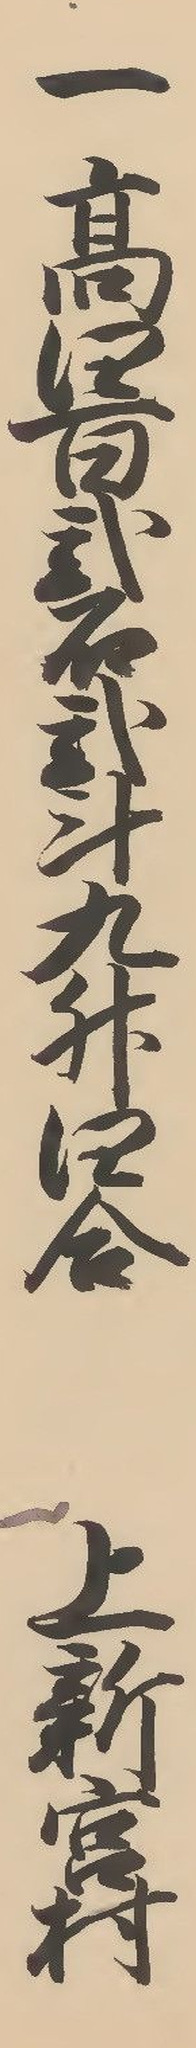一髙四百弐石弐斗九升四合上新宮村

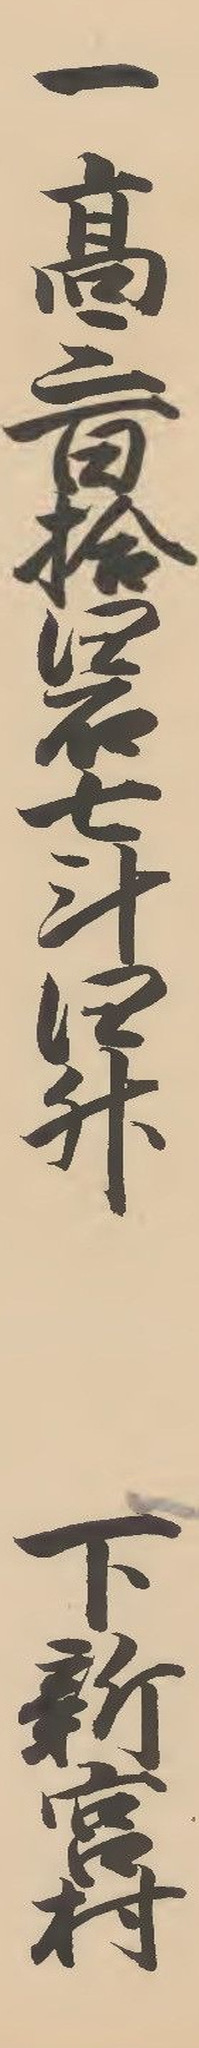一髙三百拾四石七斗四升下新宮村
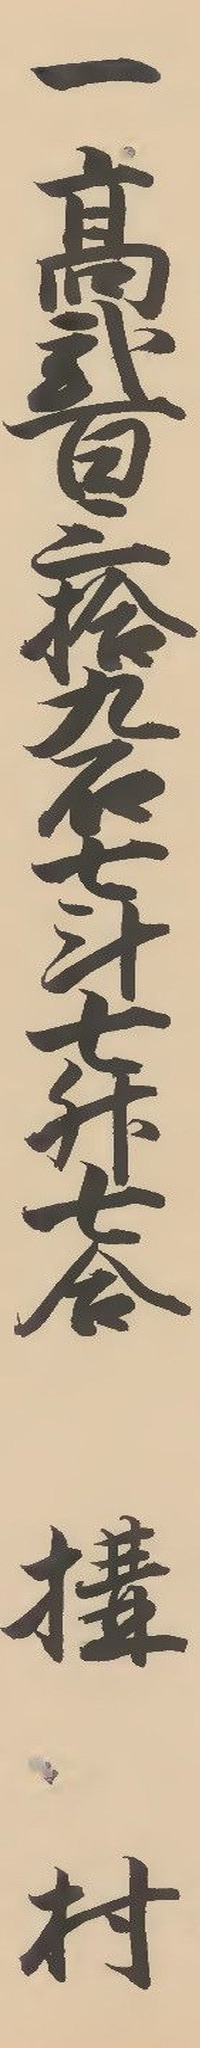一髙弐百三拾九石七斗七升七合構村
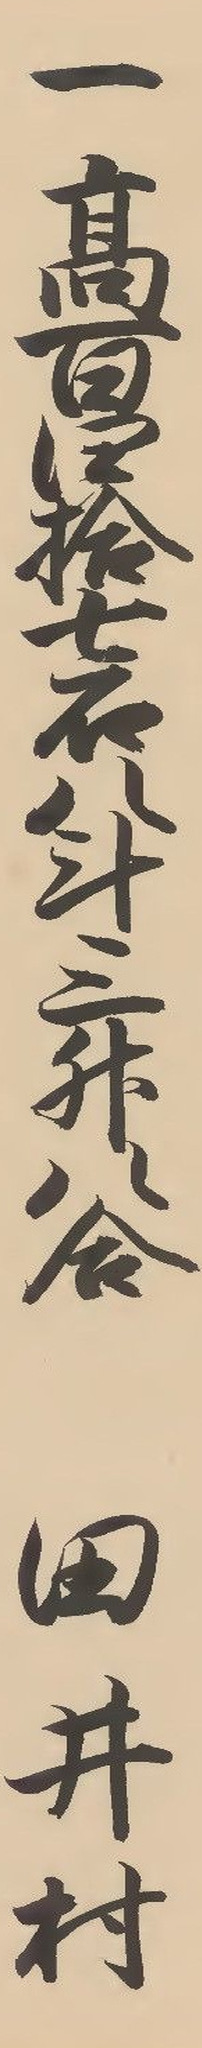一髙百四拾七石八斗三升八合田井村
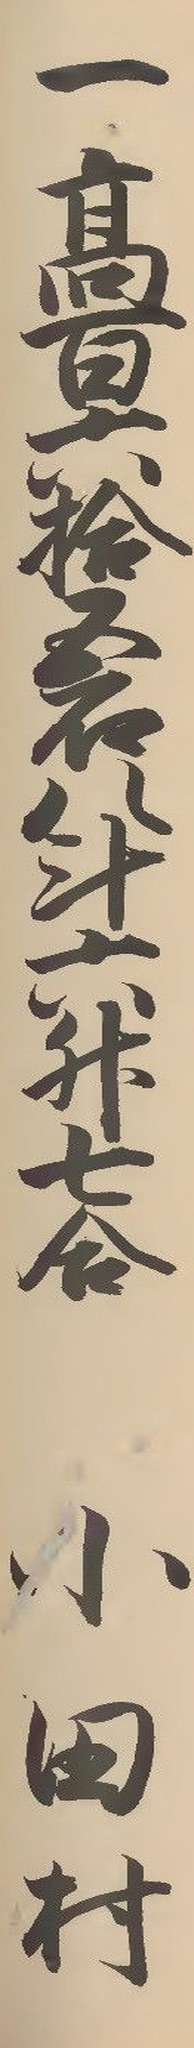一髙百六拾五石八斗六升七合小田村
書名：播磨国郷帳
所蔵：国立公文書館 National Archives of Japan
